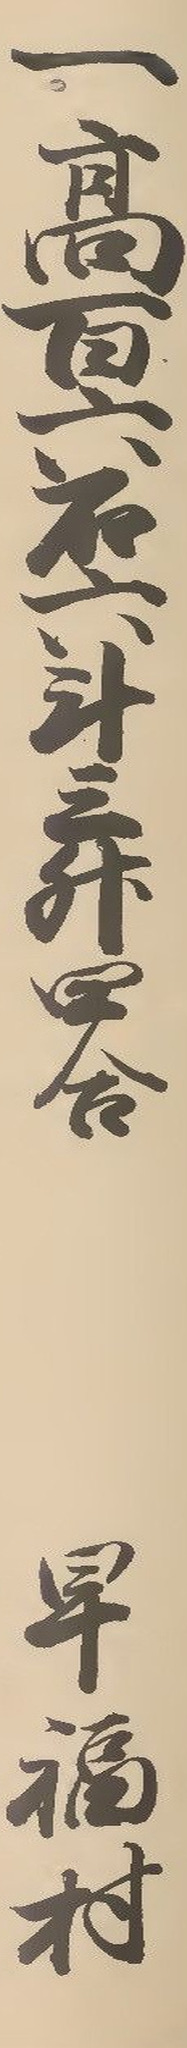一髙百六石六斗三升四合早福村
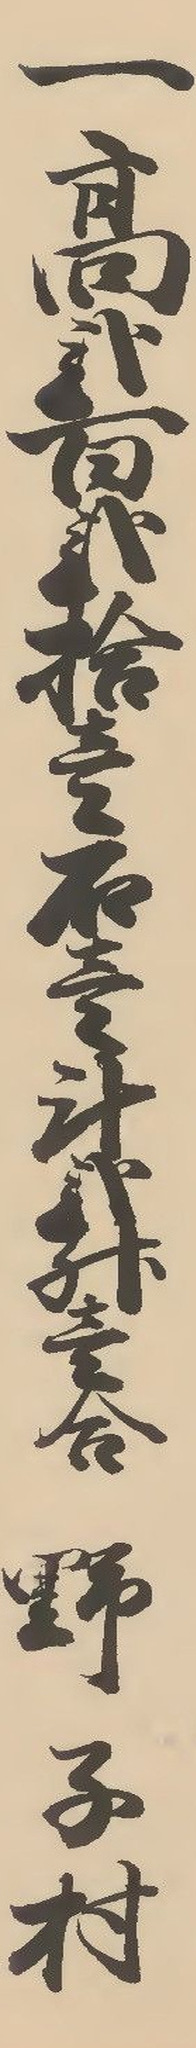一髙弐百弐拾壱石壱斗弐升壱合野子村
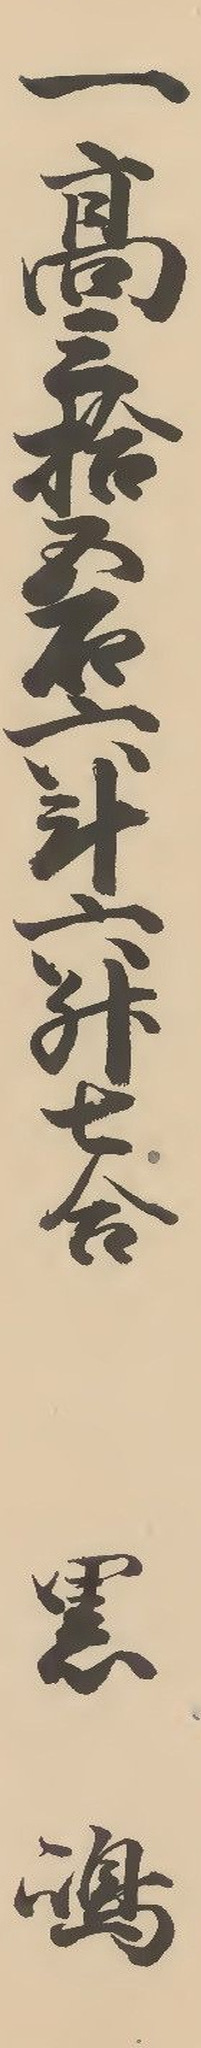一髙三拾五石六斗六升七合黑嶋
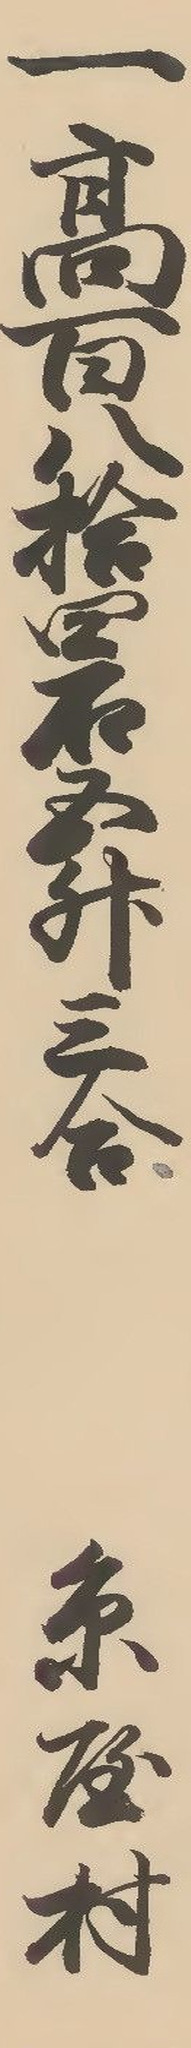一髙百八拾四石五升三合糸屋村

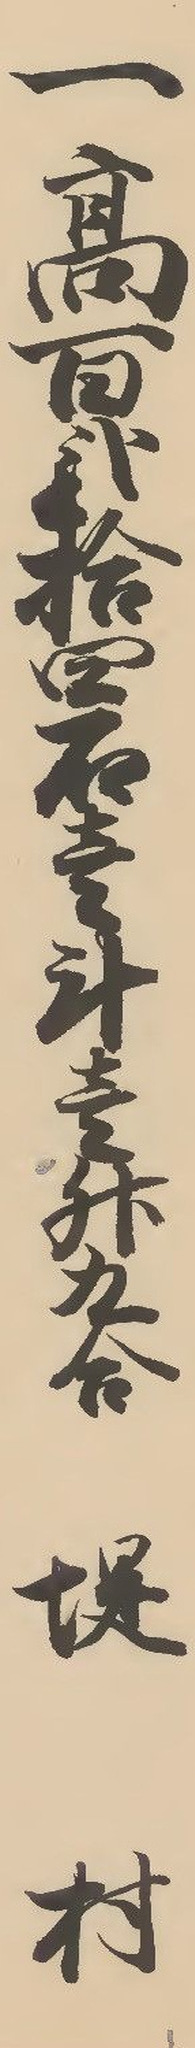一髙百弐拾四石壱斗壱升九合堤村
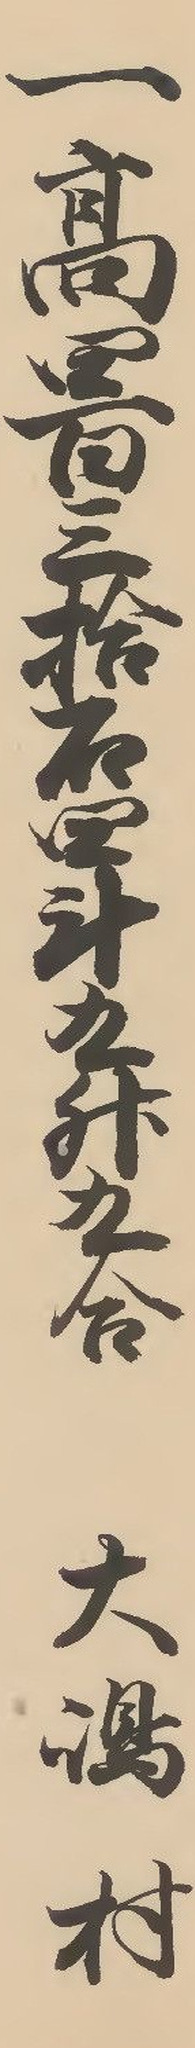一髙四百三拾石四斗九升九合大嶋村
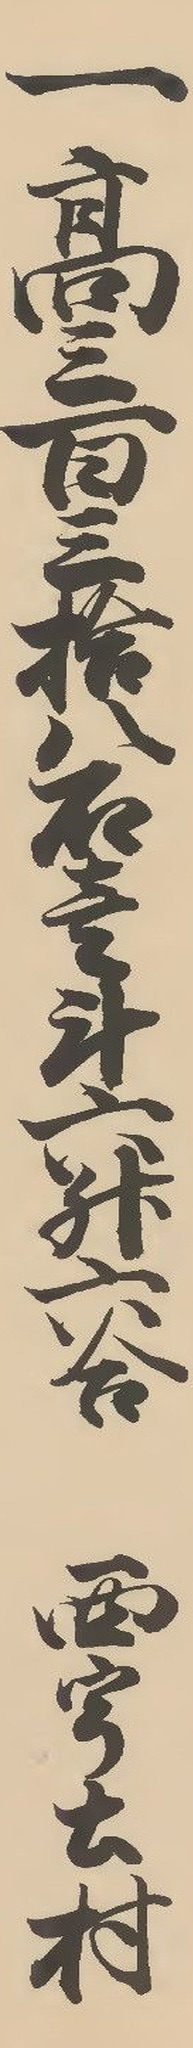一髙三百三拾八石壱斗六升六合西宇土村
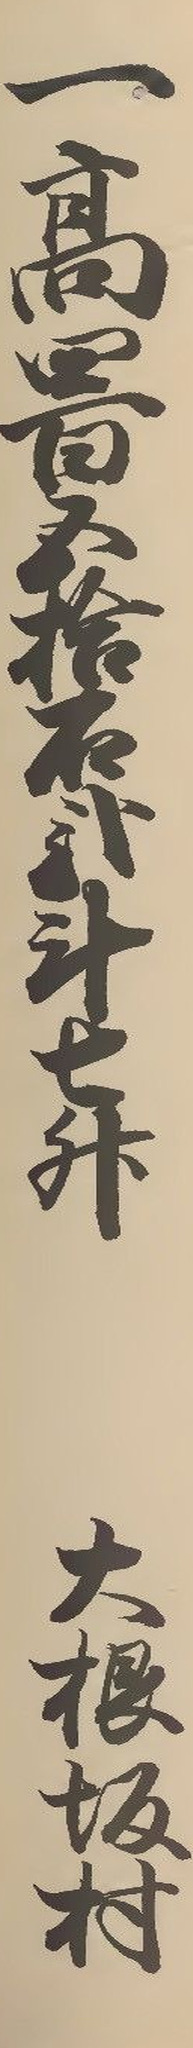一髙四百五拾石弐斗七升大根坂村
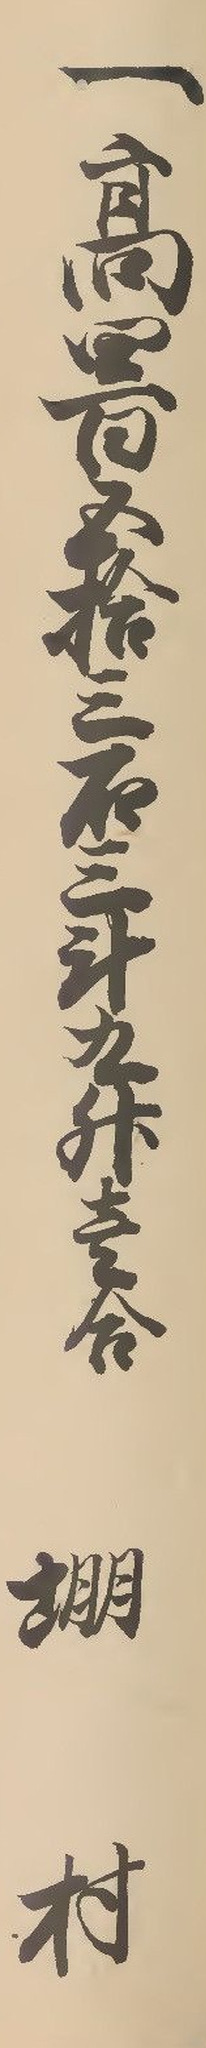一髙四百五拾三石三斗九升壱合棚村
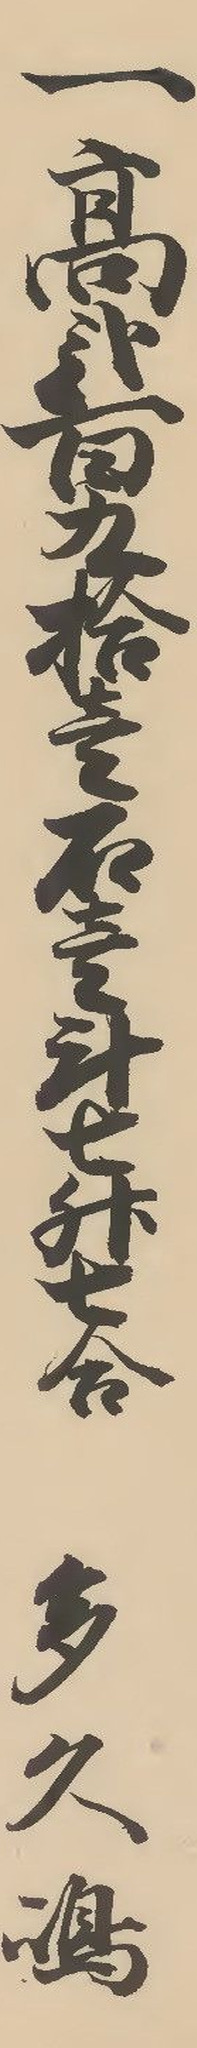一髙弐百九拾壱石壱斗七升七合多久嶋
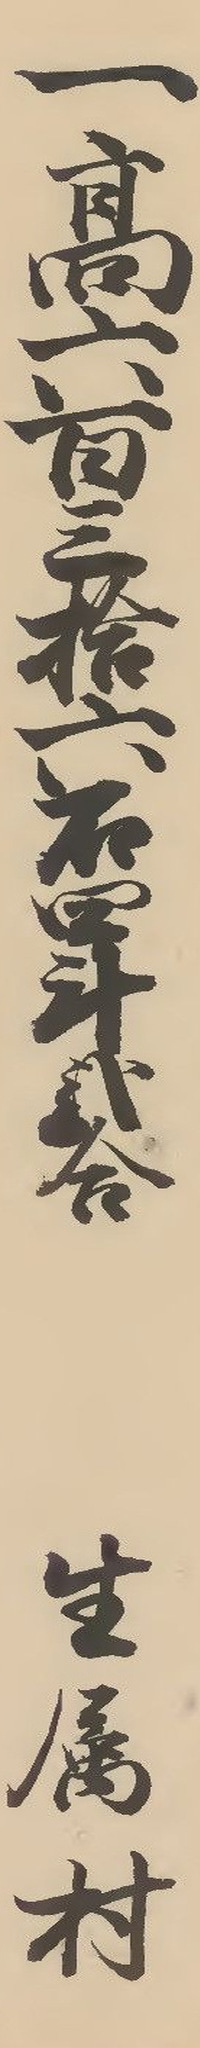一髙六百三拾六石四斗二合生属村
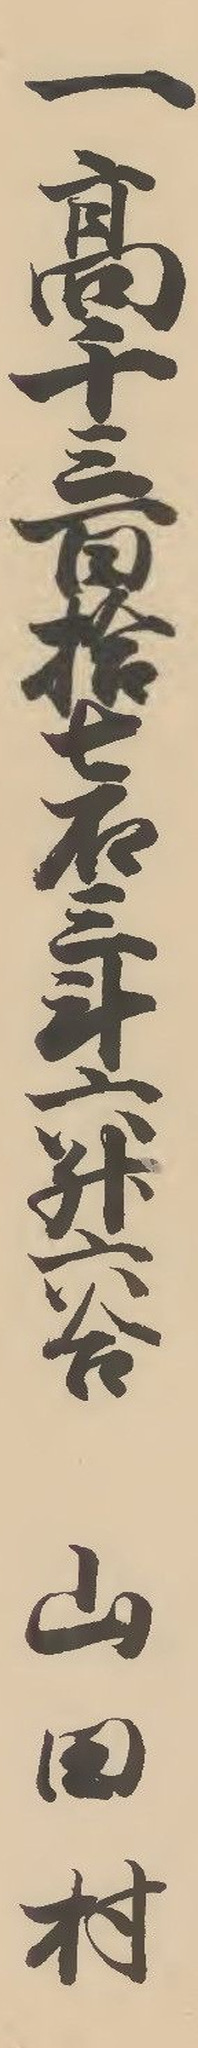一髙千三百拾七石三斗六升六合山田村

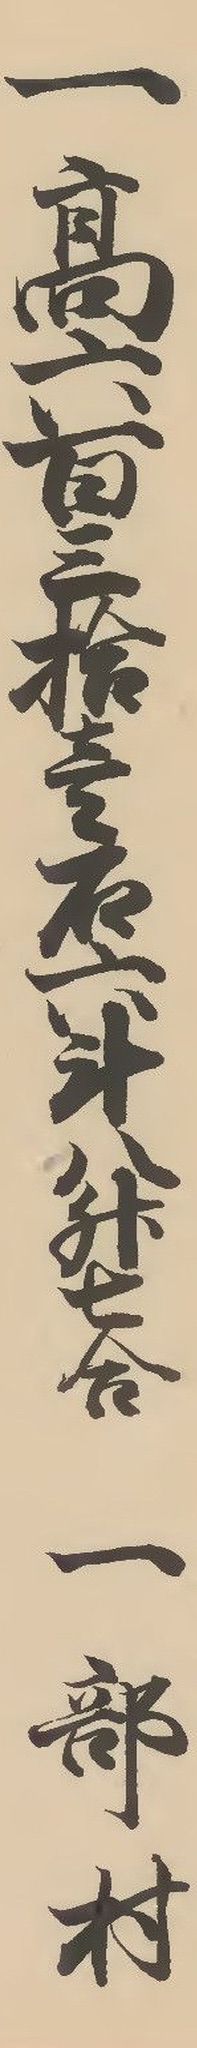一髙六百三拾壱石六斗八升七合一部村
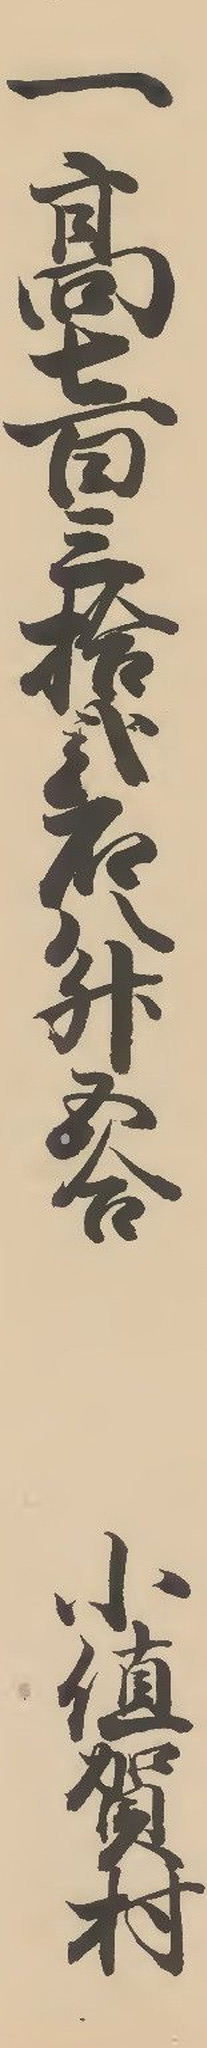一髙七百三拾弐石八升五合小値賀村
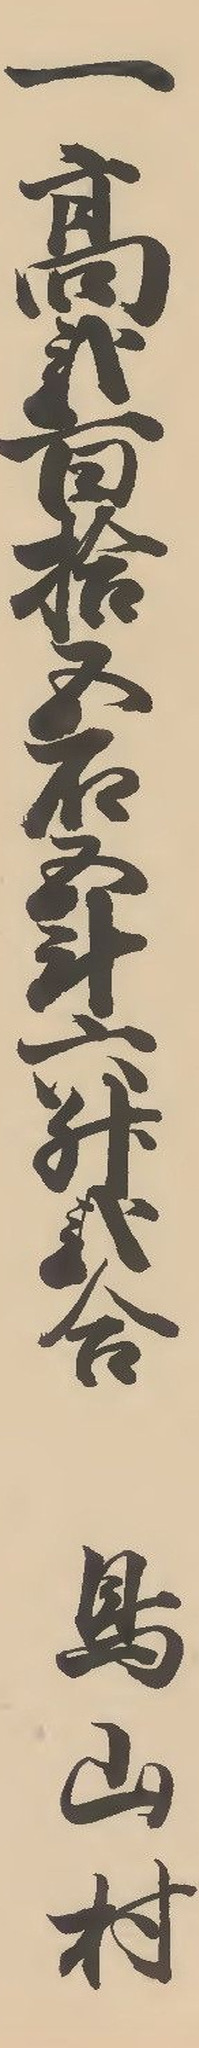一髙弐百拾五石五斗六升弐合鳥山村
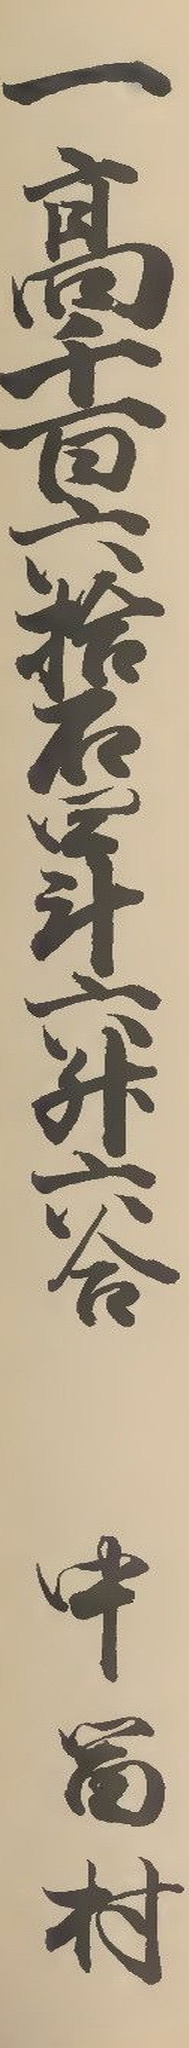一髙千百六拾石四斗六升六合中留村
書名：肥前国郷帳
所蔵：国立公文書館 National Archives of Japan
